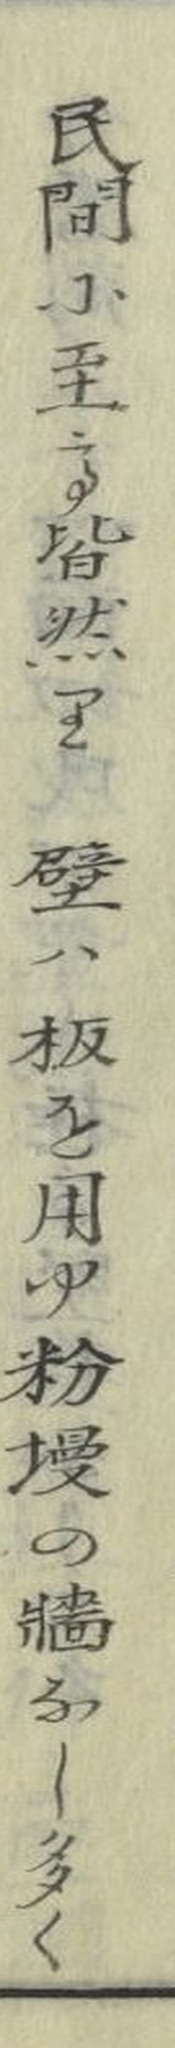民間に至て皆然り壁は板を用ゆ粉墁の牆なし多く
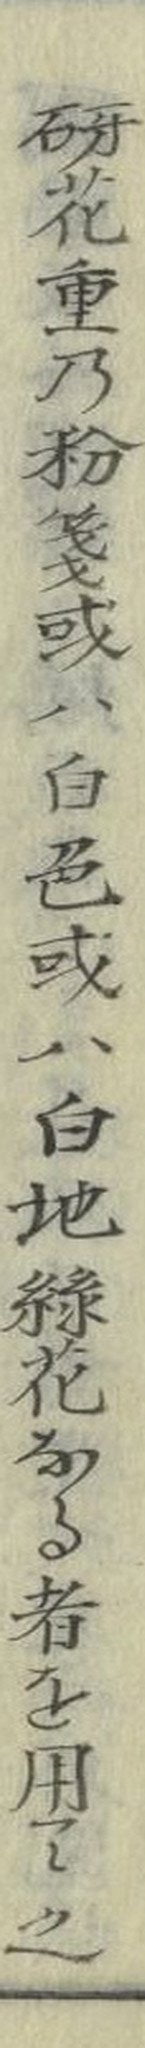研花重の粉箋或は白色或は白地緑花なる者を用て之
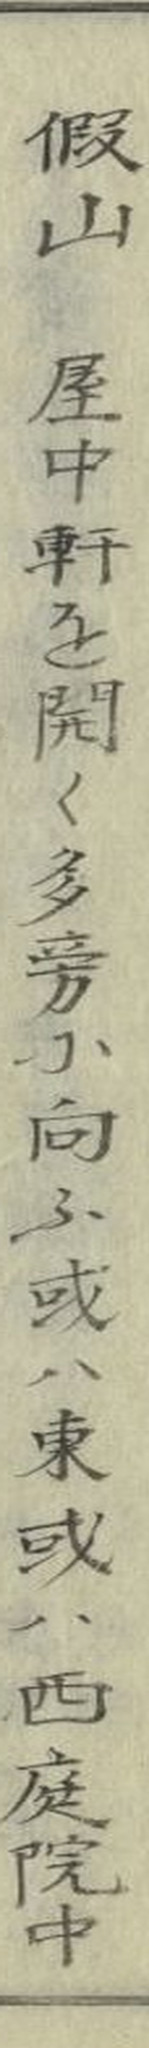假山屋中軒を開く多旁に向ふ或は東或は西庭院中
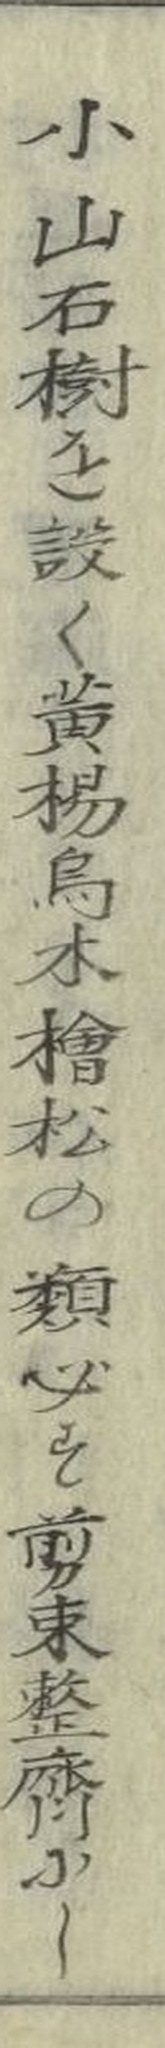小山石樹を設く黄楊烏木檜松の類必す剪束整齊にし
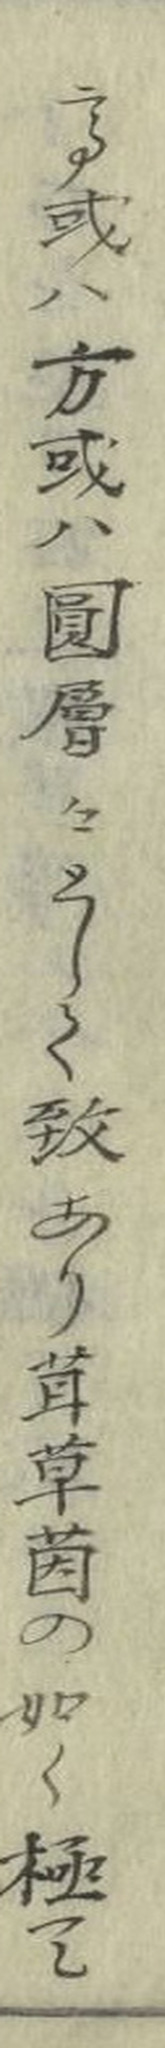て或は方或は円層々として致あり茸草茵の如く極て
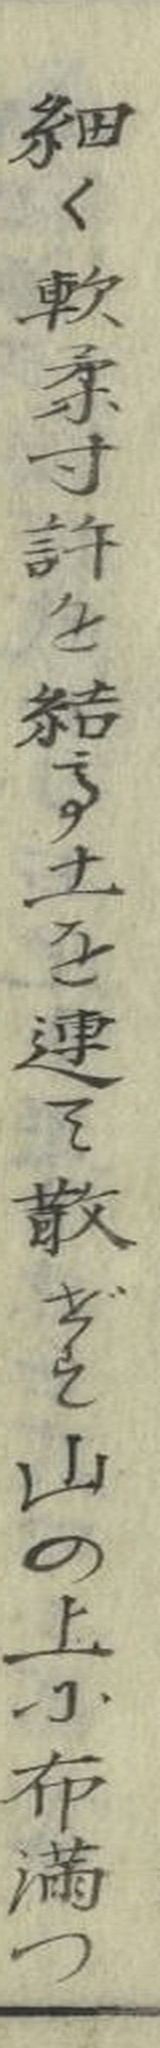細く軟柔寸許を結て土を連て散ぜす山の上に布満つ

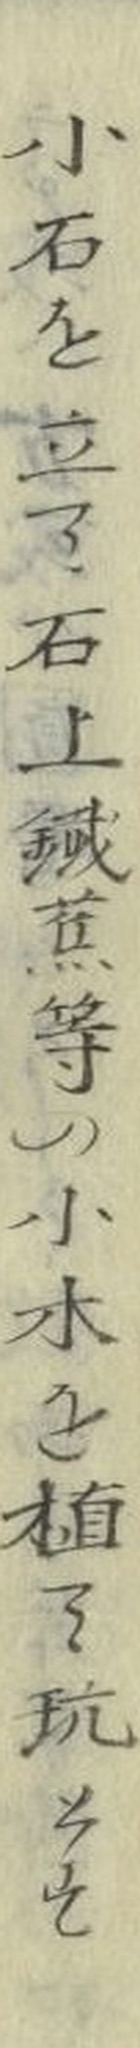小石を立て石上鉄蕉等の小木を植て玩とす
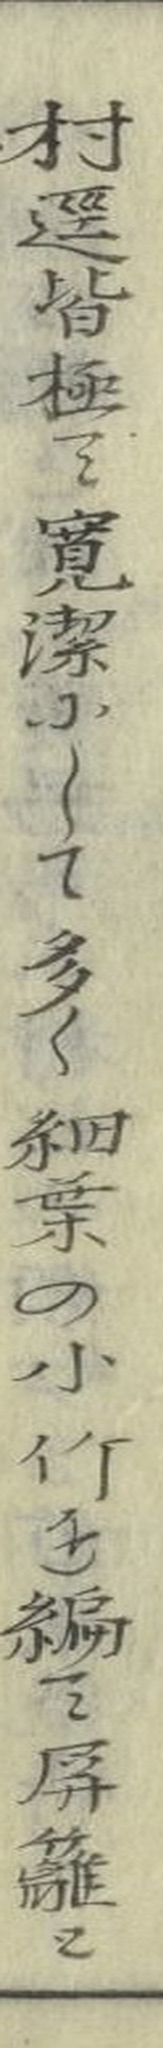村径皆極て寛潔にして多く細葉の小竹を編て屏籬と
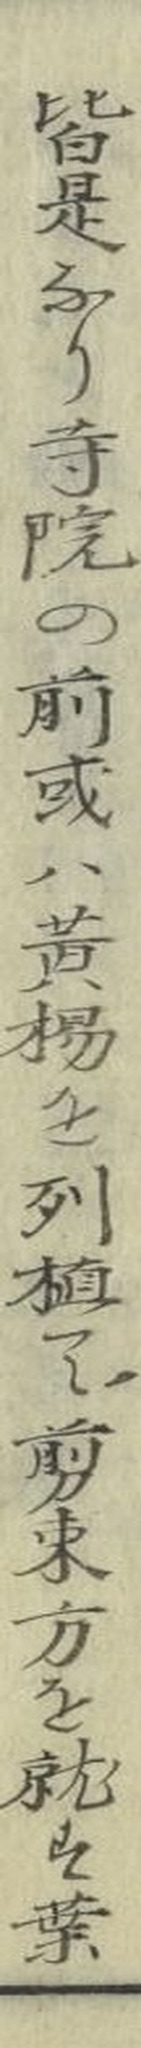皆是なり寺院の前或は黄楊を列植て剪束方を就す葉
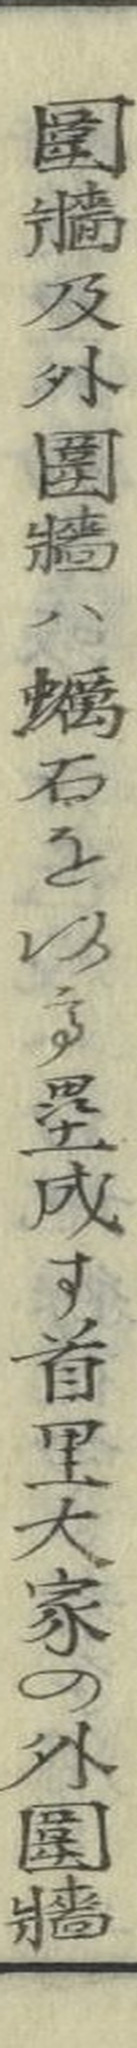囲牆及外囲牆は蠣石を以て塁成す首里大家の外囲牆
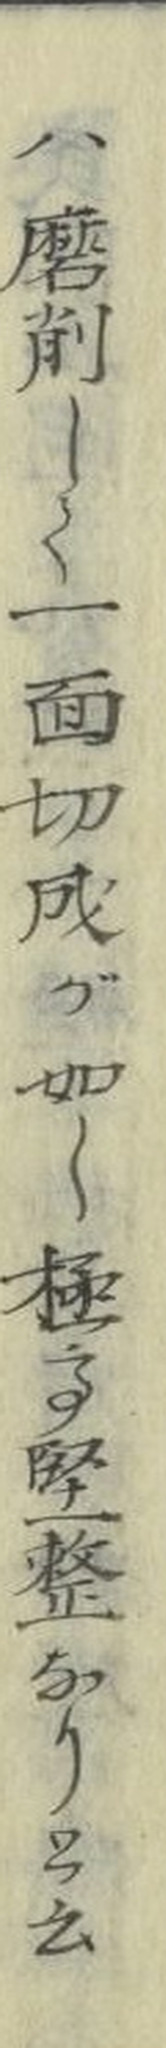は磨削して一面切成が如し極て堅整なりと云
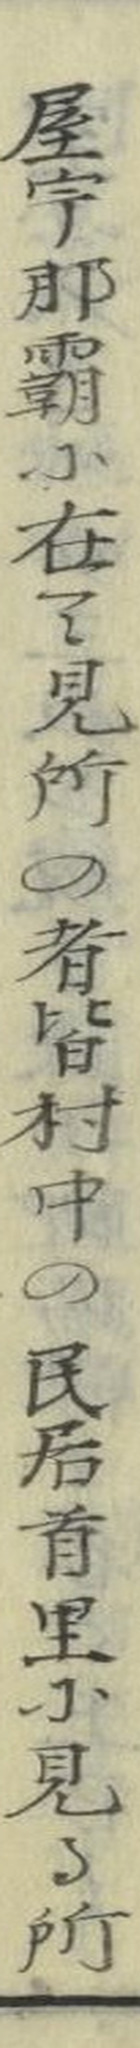屋宇那覇に在て見所の者皆村中の民居首里に見る所
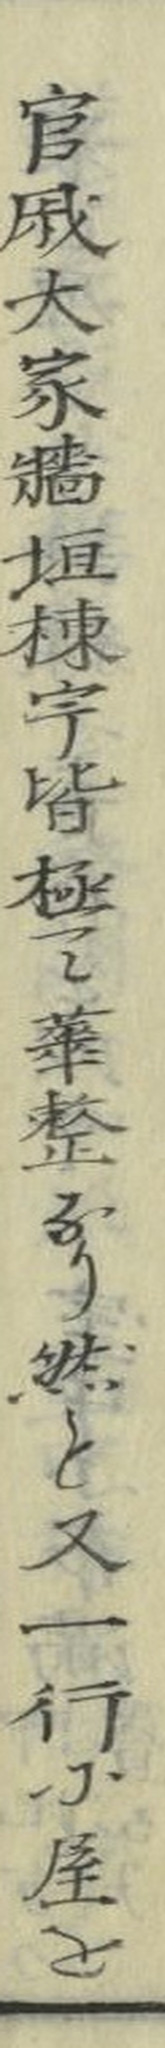官戚大家牆垣棟宇皆極て華整なり然も又一行に屋を
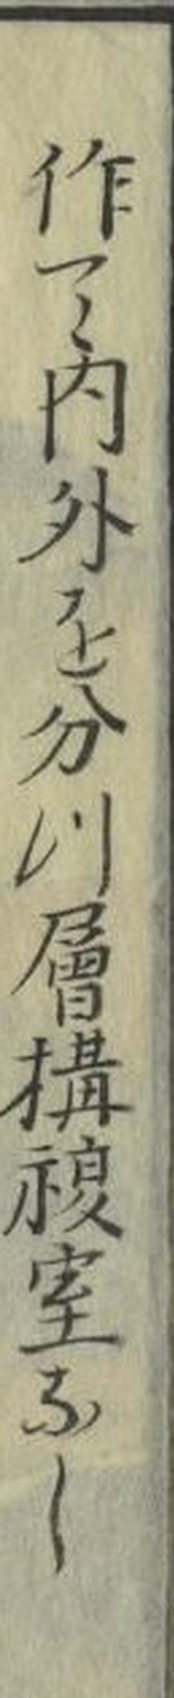作て内外を分つ層構複室なし
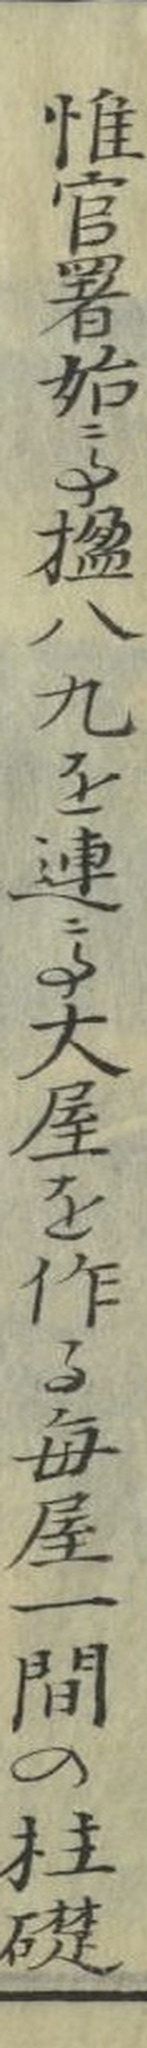惟官署始て楹八九を連て大屋を作る毎屋一間の柱礎
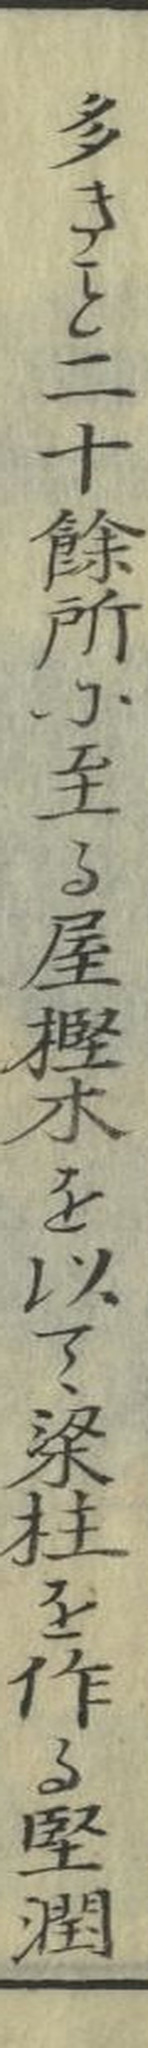多きこと二十餘所に至る屋樫木を以て梁柱を作る堅潤
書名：琉球沿革志 上
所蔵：University of the Ryukyus Library
